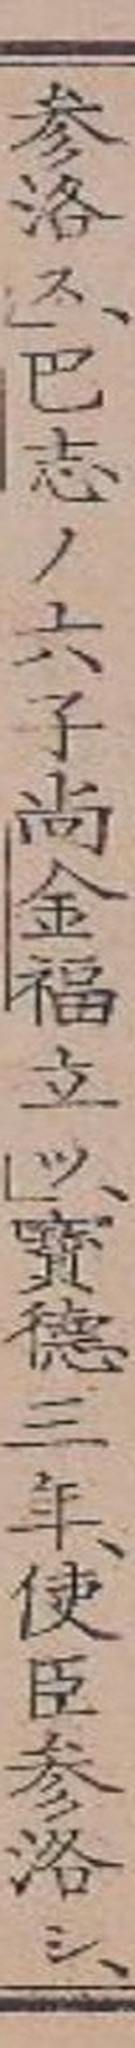参洛ス、」巴志ノ六子尚金福立ツ、」宝徳三年、使臣参洛シ、
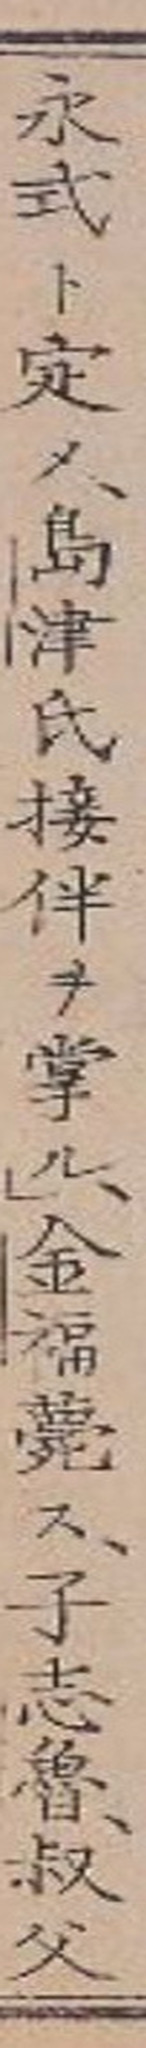永式ト定メ、島津氏接伴ヲ掌ル、」金福薧ス、子志魯、叔父
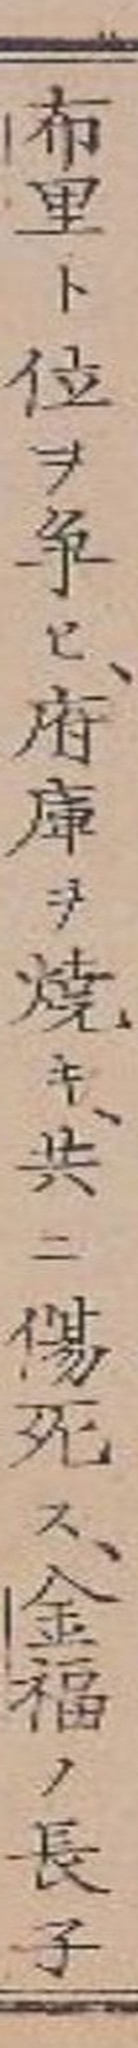布里ト位ヲ争ヒ、府庫ヲ焼キ、共ニ傷死ス、金福ノ長子
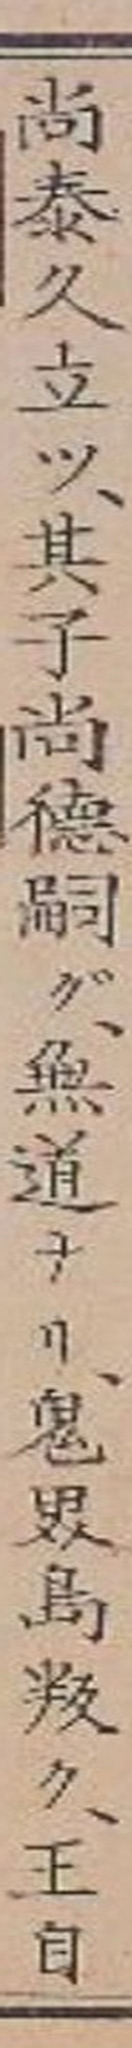尚泰久立ツ、其子尚徳嗣グ、無道ナリ、鬼界島叛ク、王自
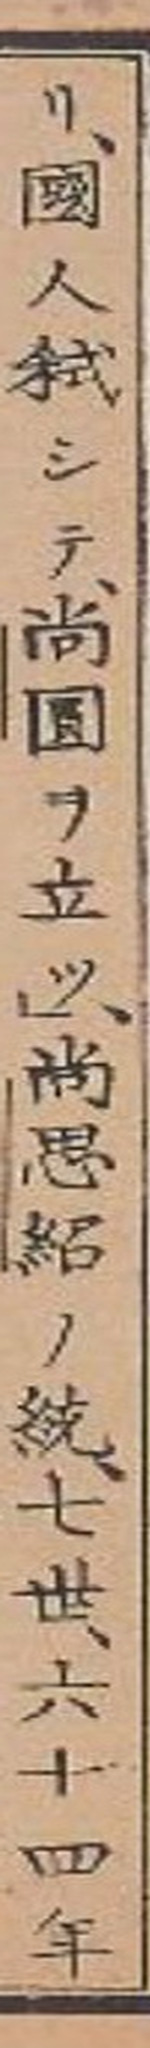リ、国人弑シテ、尚円ヲ立ツ、」尚思紹ノ統、七世、六十四年
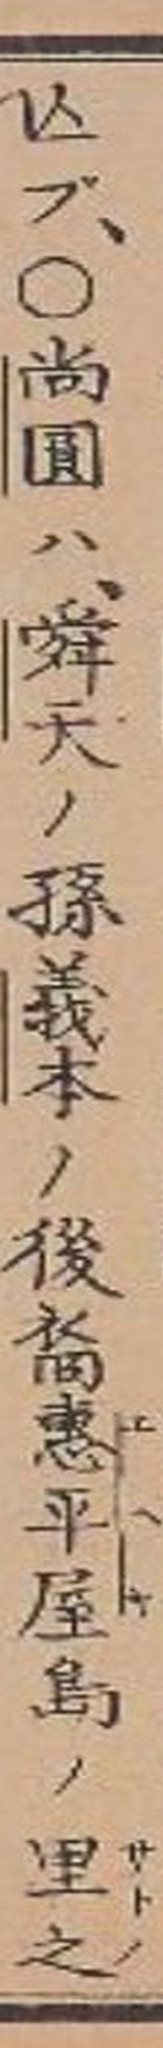亡ブ、○尚円ハ、舜天ノ孫義本ノ後裔恵平屋島ノ里之
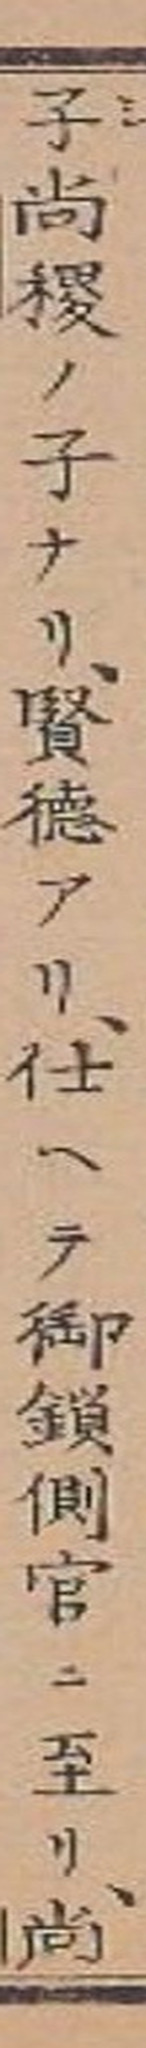子尚稷ノ子ナリ、賢徳アリ、仕ヘテ御鎖側官ニ至リ、尚
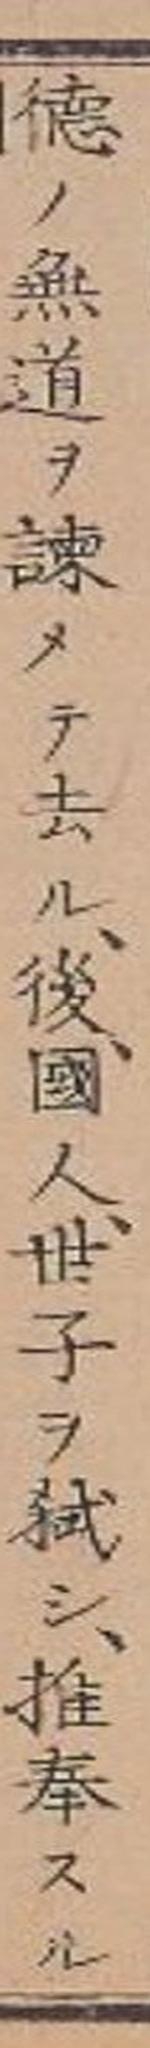徳ノ無道ヲ諫メテ去ル、後、国人、世子ヲ弑シ、推奉スル
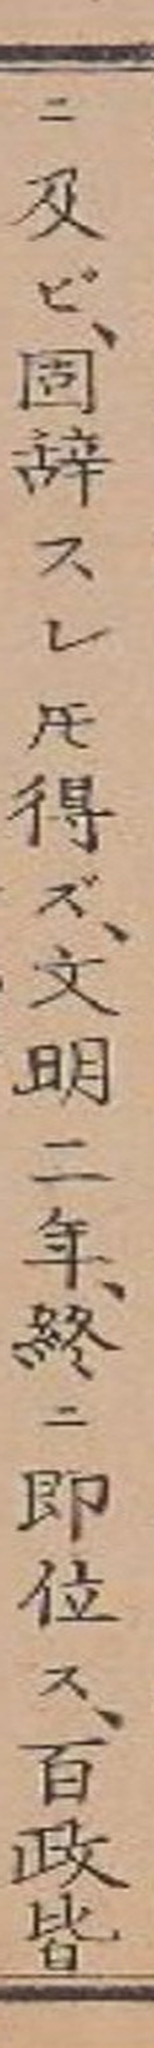ニ及ビ、固辞スレトモ得ズ、文明二年、終ニ即位ス、百政皆
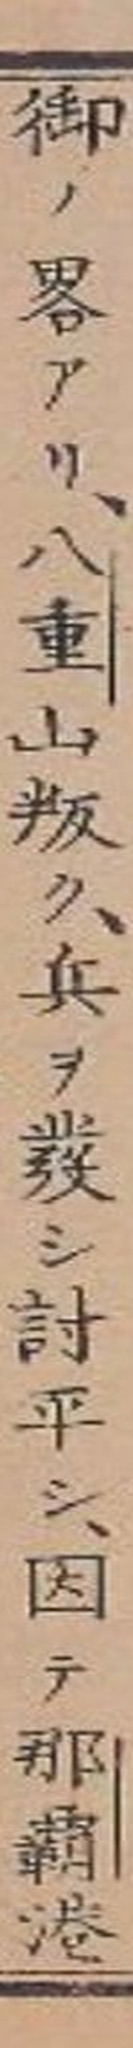御ノ略アリ、八重山叛ク、兵ヲ発シ討平シ、因テ那覇港
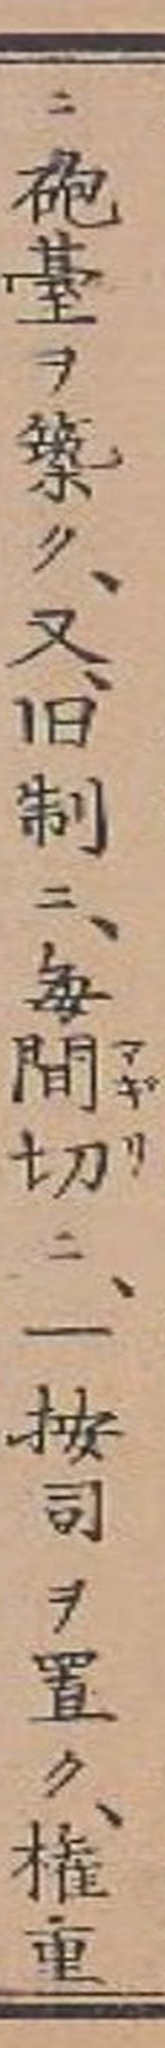ニ砲台ヲ築ク、又、旧制ニ、毎間切ニ、一按司ヲ置ク、権重
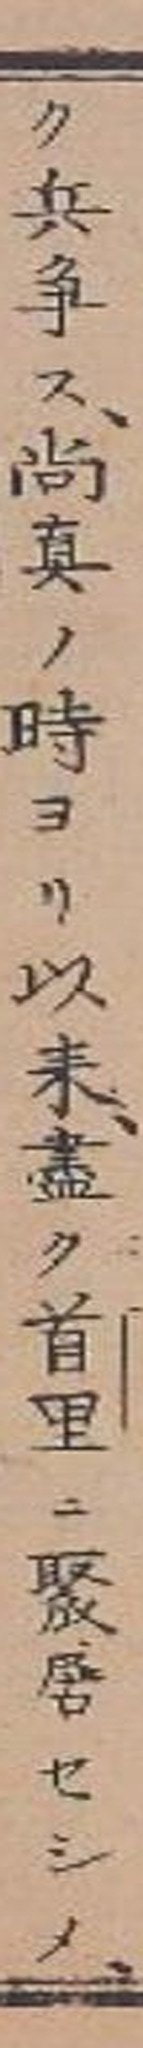ク兵争ス、尚真ノ時ヨリ以来、尽ク首里ニ聚居セシメ、
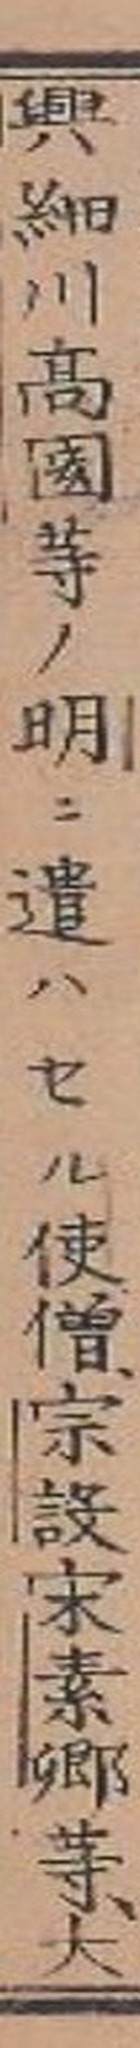興細川高国等ノ明ニ遣ハセル使僧、宗設宋素卿等、大

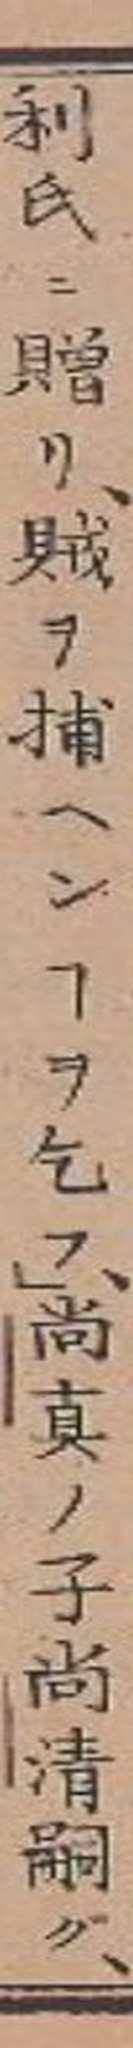利氏ニ贈リ、賊ヲ捕ヘンヿヲ乞フ、」尚真ノ子尚清嗣グ、
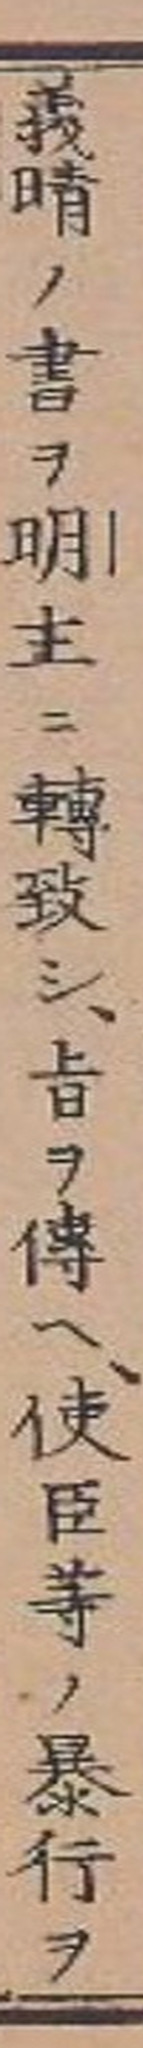義晴ノ書ヲ明主ニ転致シ、旨ヲ伝ヘ、使臣等ノ暴行ヲ
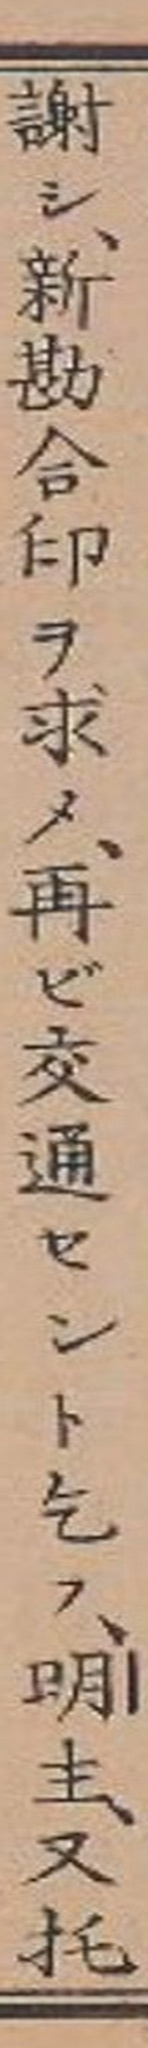謝シ、新勘合印ヲ求メ、再ビ交通セント乞フ、明主、又托
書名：琉球新誌 巻上
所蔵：University of the Ryukyus Library
